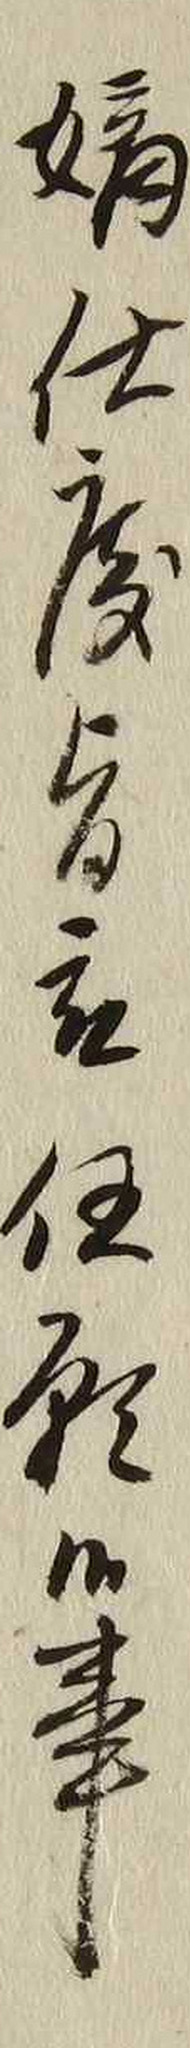嫡仕度旨被任願候事
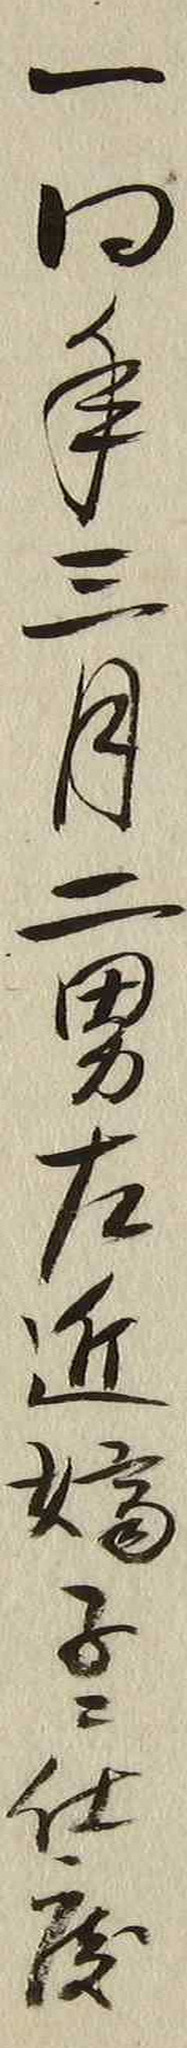一同年三月二男左近嫡子ニ仕度
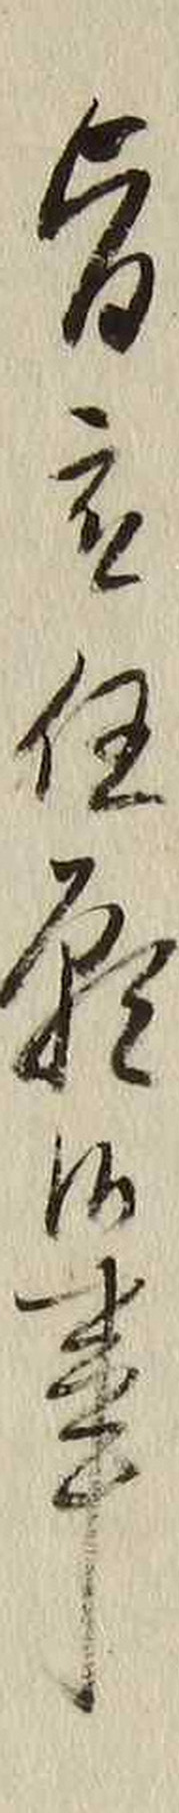旨被任願候事
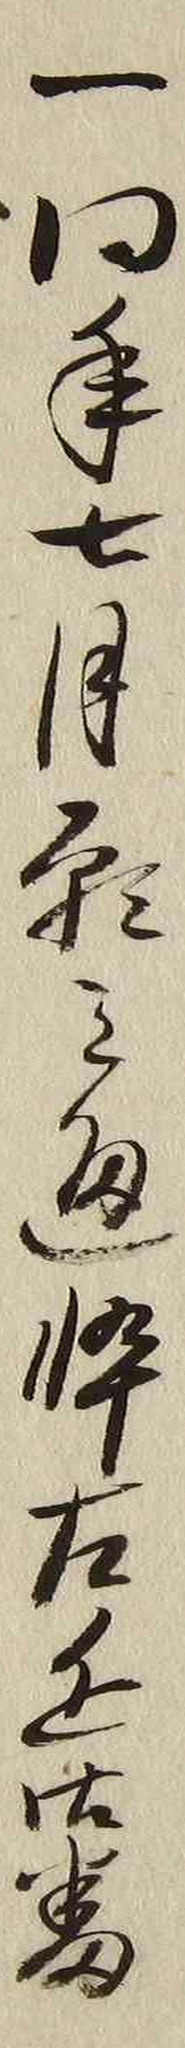一同年七月願之通忰左近御番
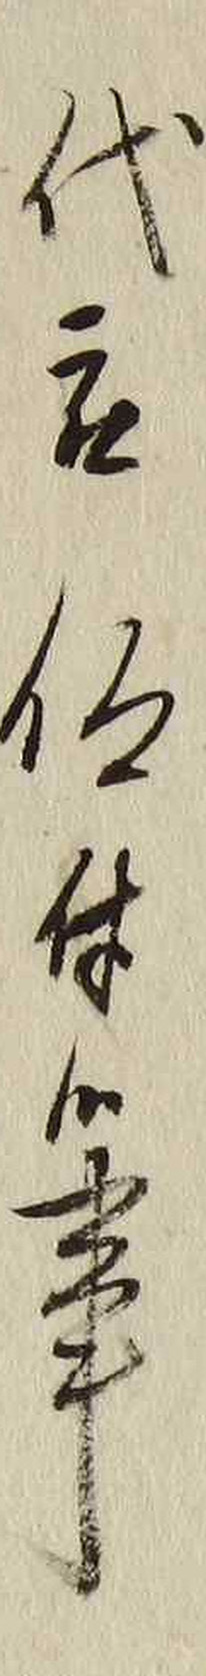代被仰付候事
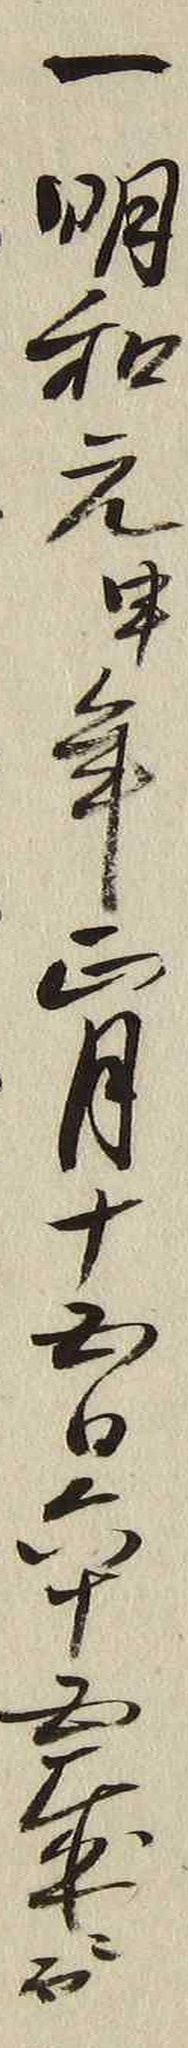一明和元申年正月十五日六十五歳ニ而
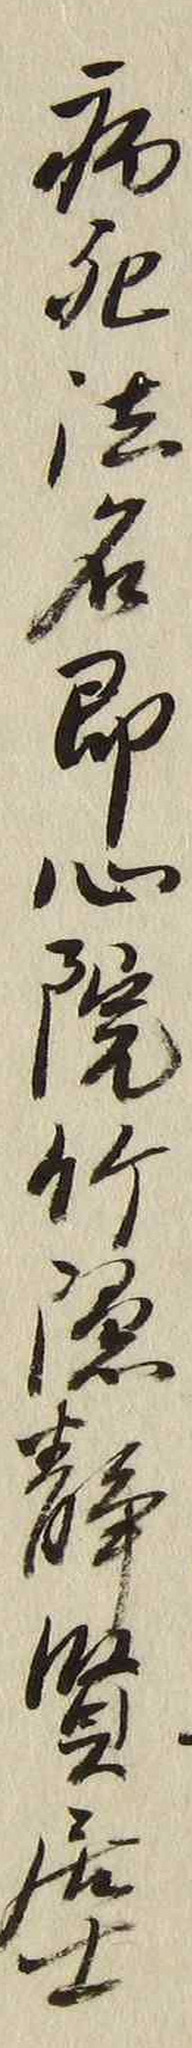病死法名即心院竹隠静賢居士

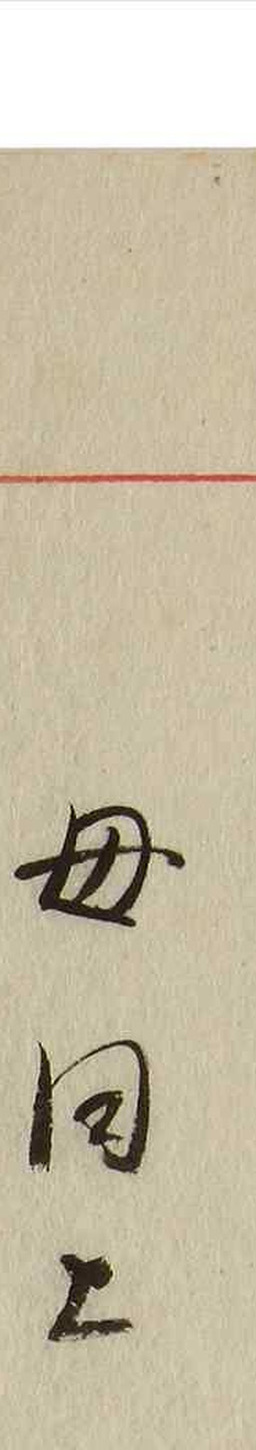母同上
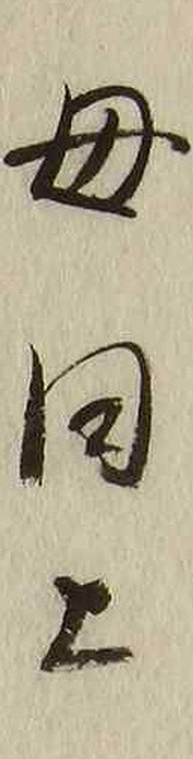母同上
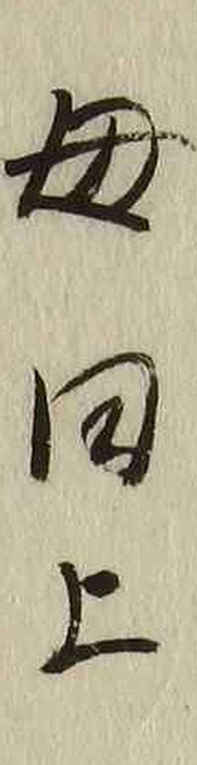母同上
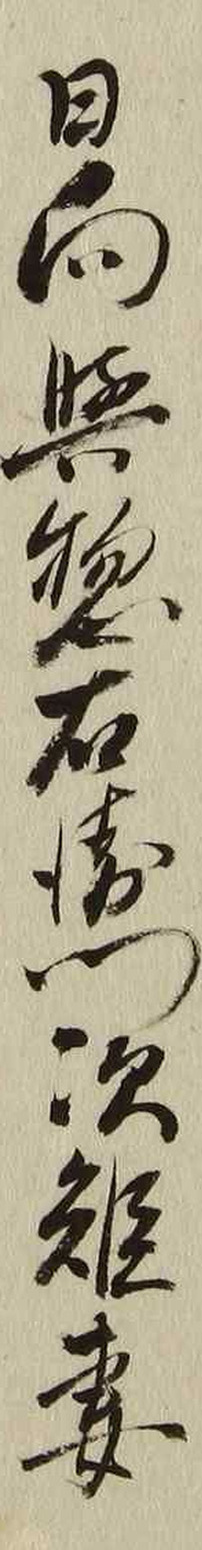女日向与惣右衛門次矩妻
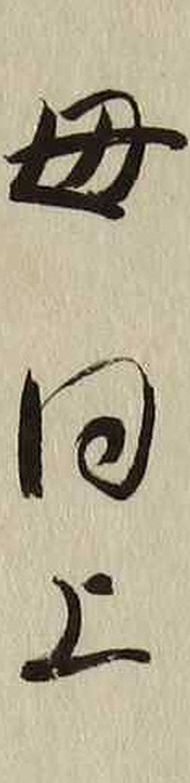母同上
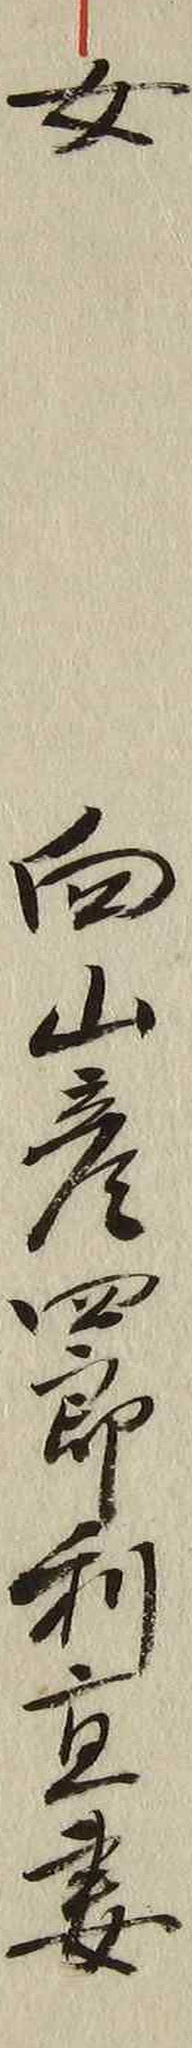女向山彦四郎利宣妻
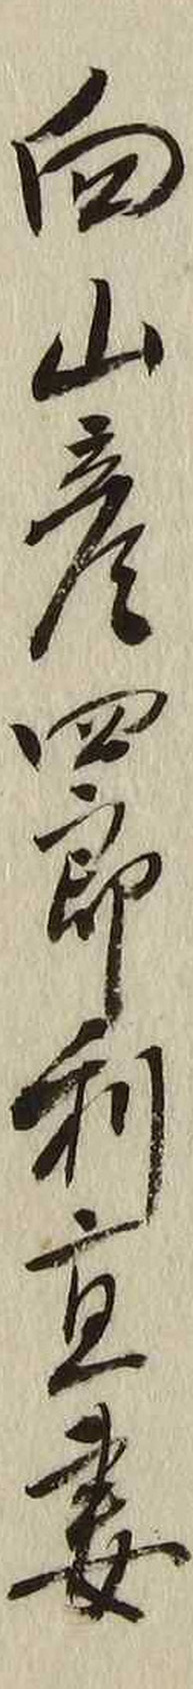女向山彦四郎利宣妻
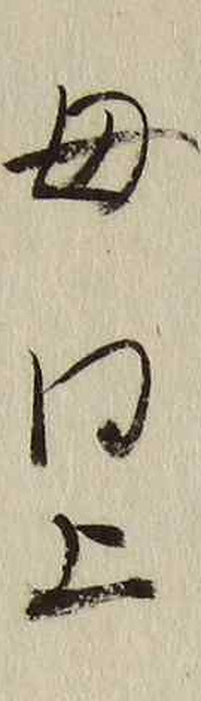母同上
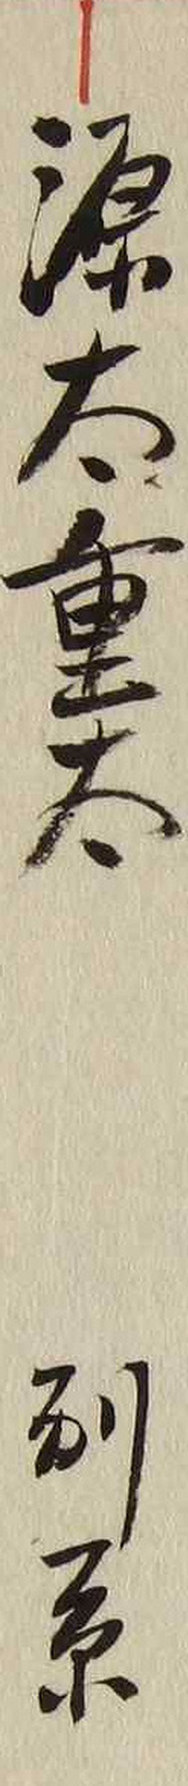源太重太別系
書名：諸士系譜　巻之355　す之部5
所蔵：会津若松市立会津図書館
